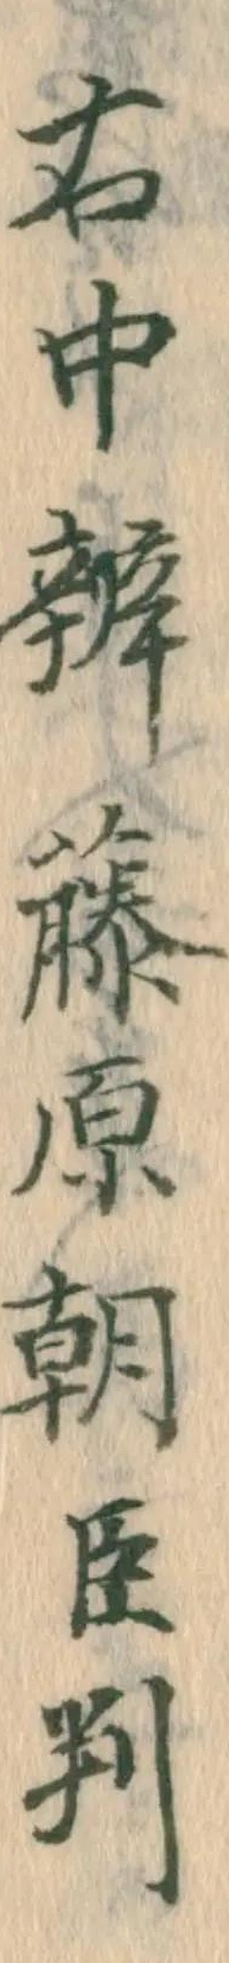右中弁藤原朝臣判
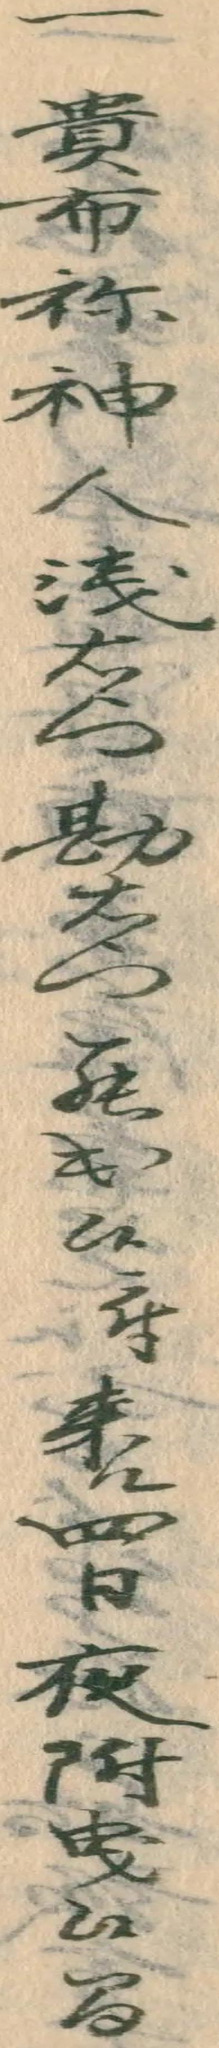一貴布祢神人浅右衛門勘右衛門罷出候ニ付来ル四日夜附曳候間
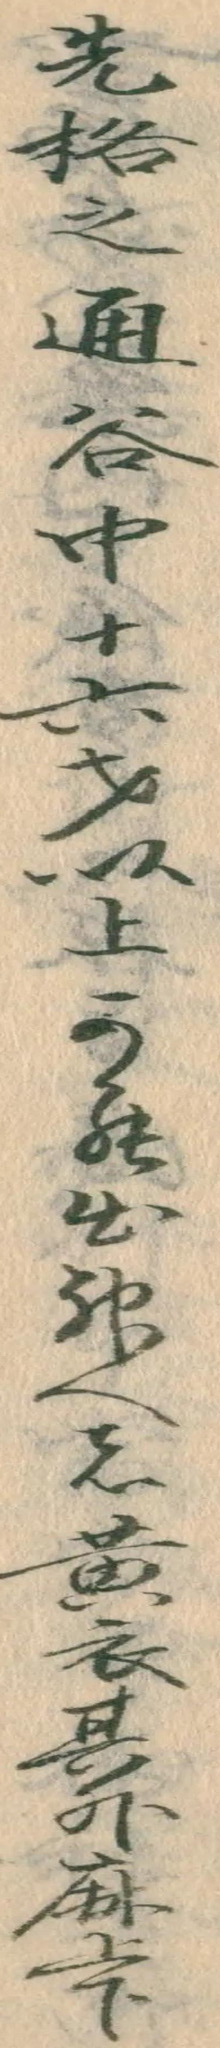先格之通谷中十六才以上可罷出神人は黄衣其外麻上下
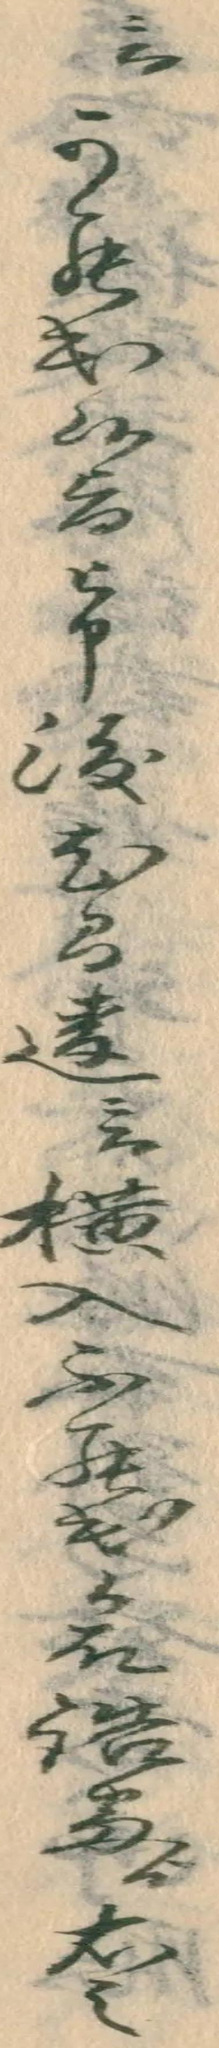ニ而可罷出旨被申渡尤間違ニ而横入不罷出候故詰番ゟ右之
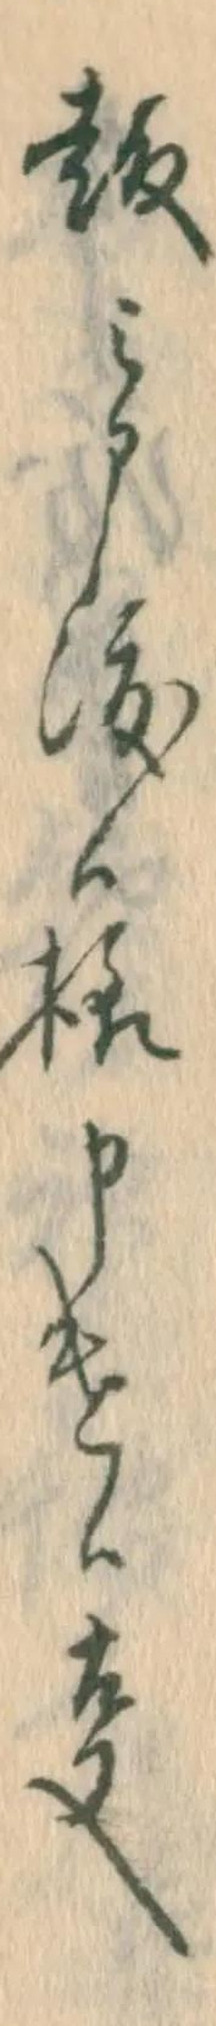趣被申渡候様申遣候事
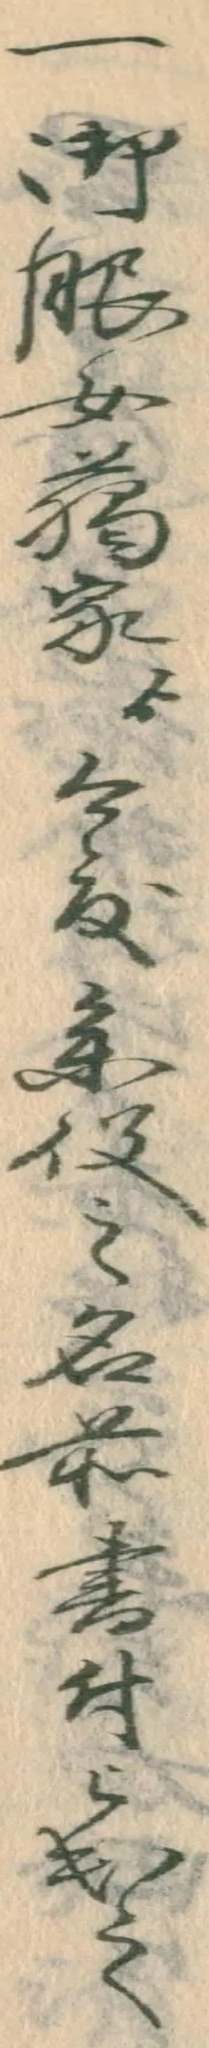一御服女臈家ゟ今度参役之名前書付被出之
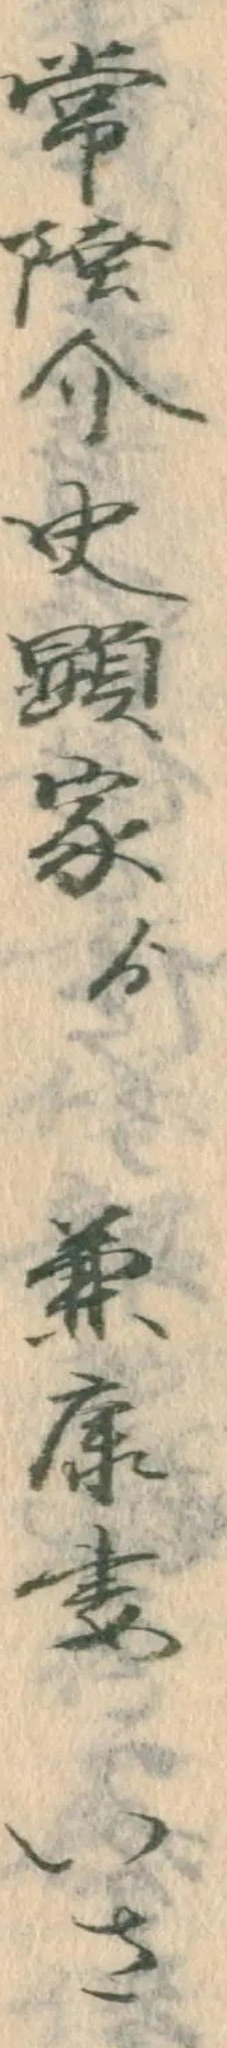常陸介史顕家ゟ兼康妻いさ
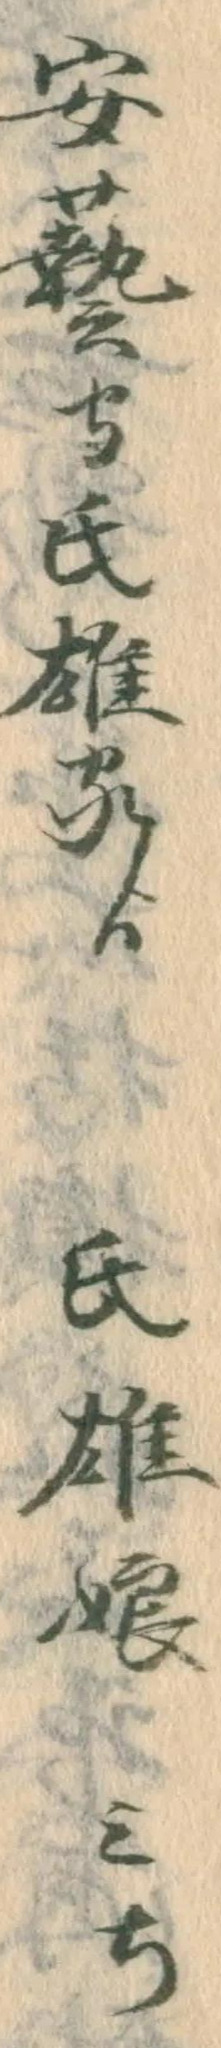安芸守氏雄家ゟ氏雄娘みち
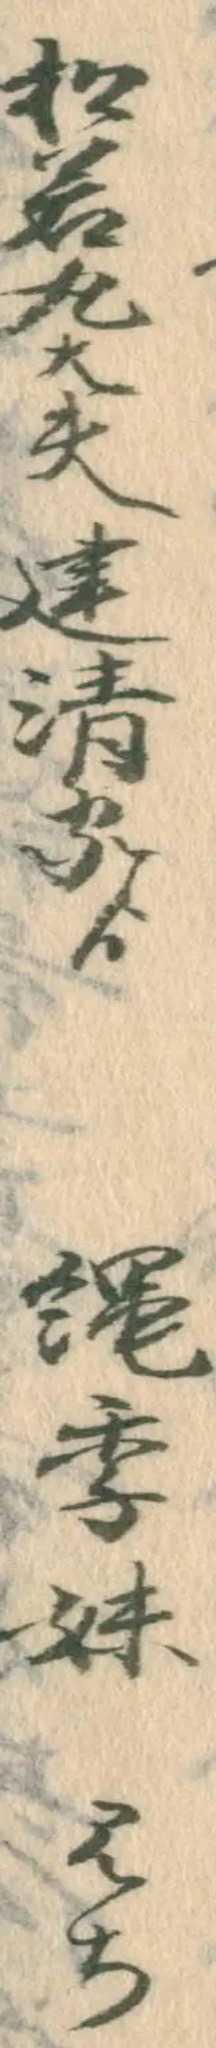松若丸大夫建清家ゟ縄季妹みち
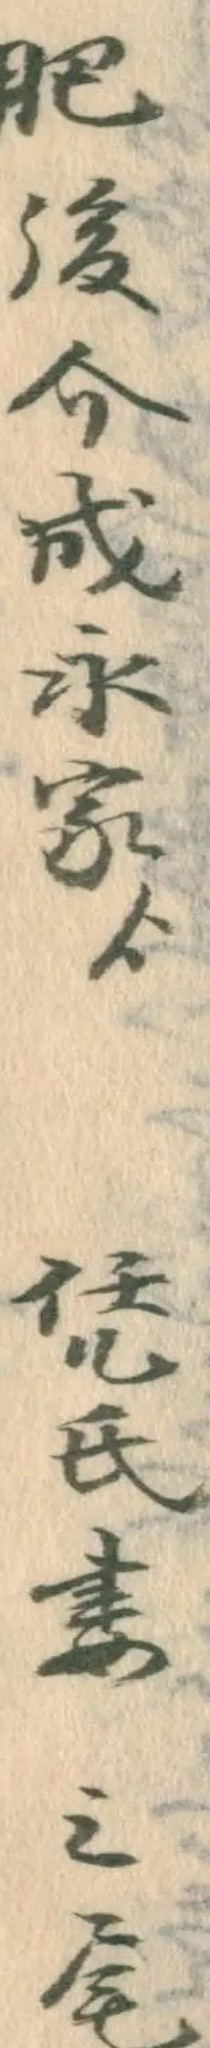肥後介成永家ゟ凭氏妻みを
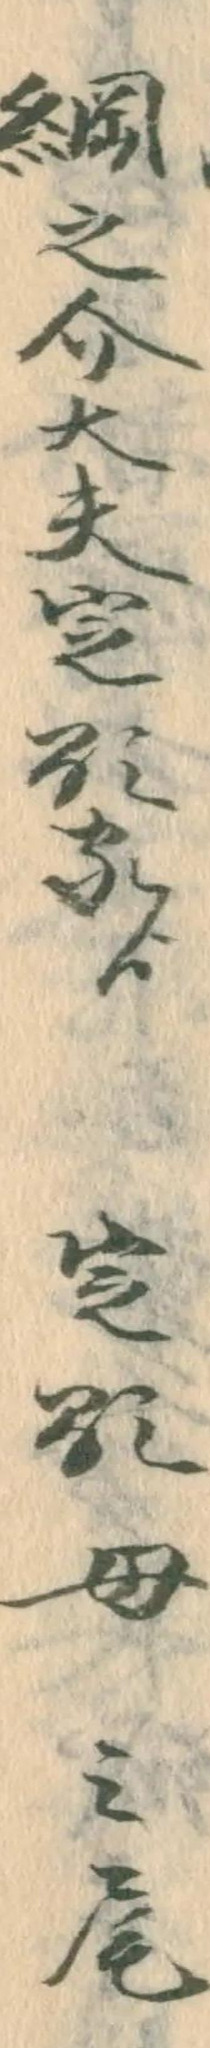綱之介大夫定顕家ゟ定顕母みを
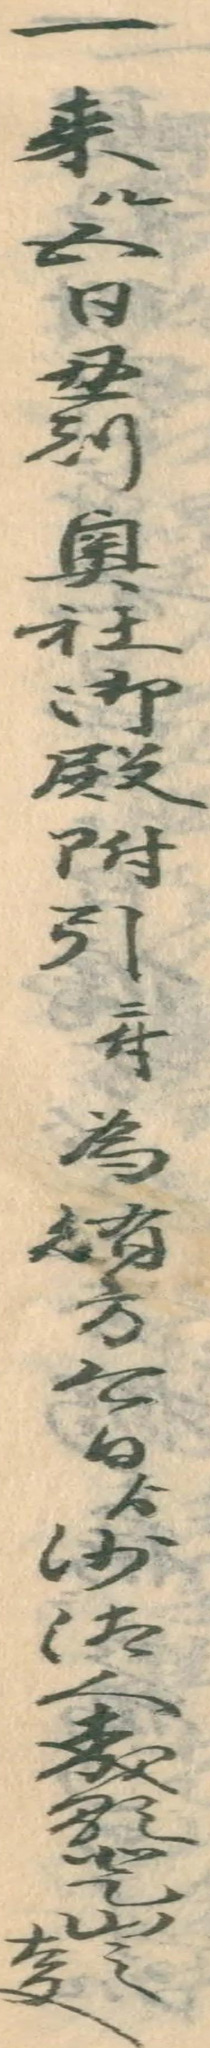一来ル五日丑刻奥社御殿附引ニ付為賄方今日ゟ沙汰人森顕登山之事

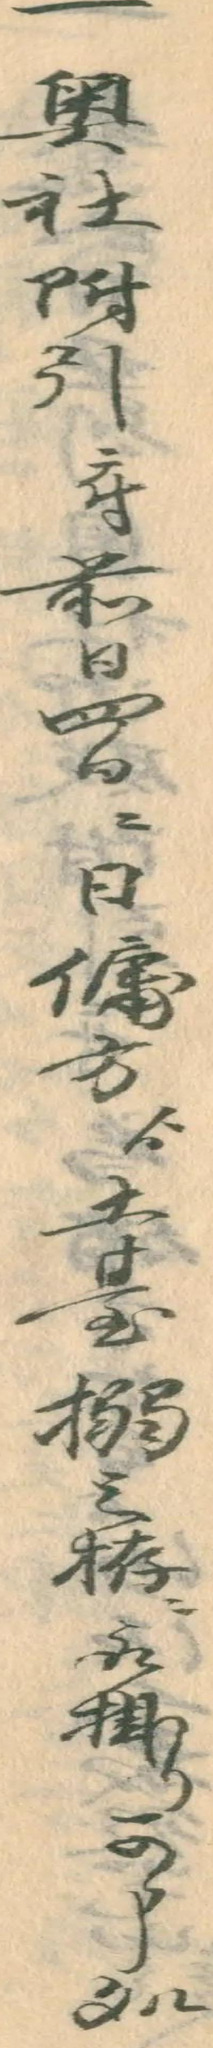一奥社附引ニ付前日四日ニ日傭方ゟ土台搦之拵ニ取掛り可申処
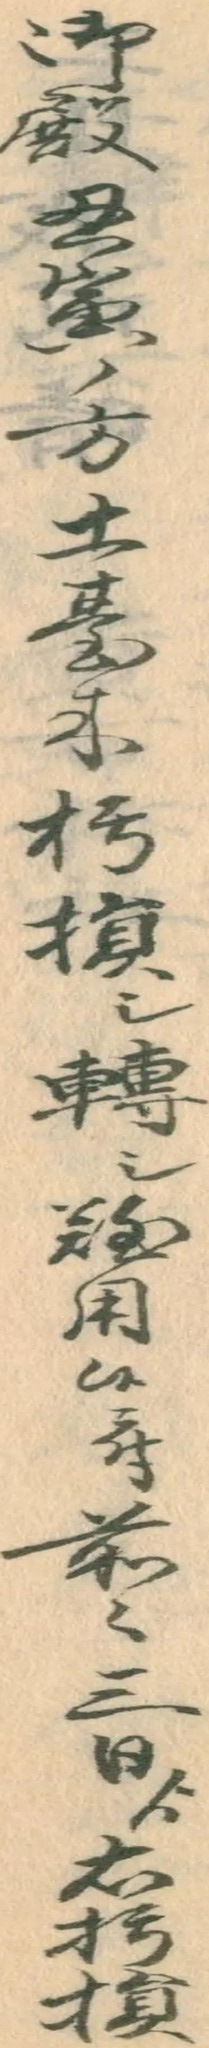御殿丑寅ノ方土台木朽損シ転シ難用候ニ付前々三日ゟ右朽損
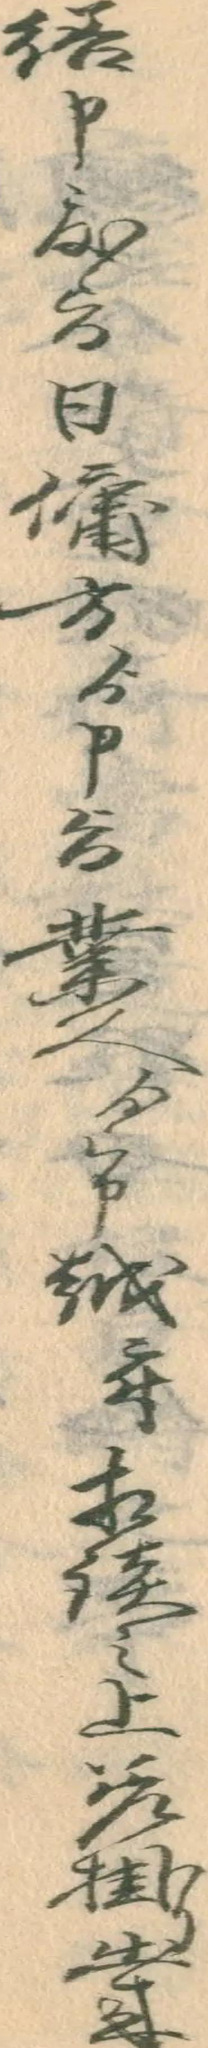繕申度旨日傭方ゟ申旨業久ゟ被申越ニ付相談之上差掛り出来
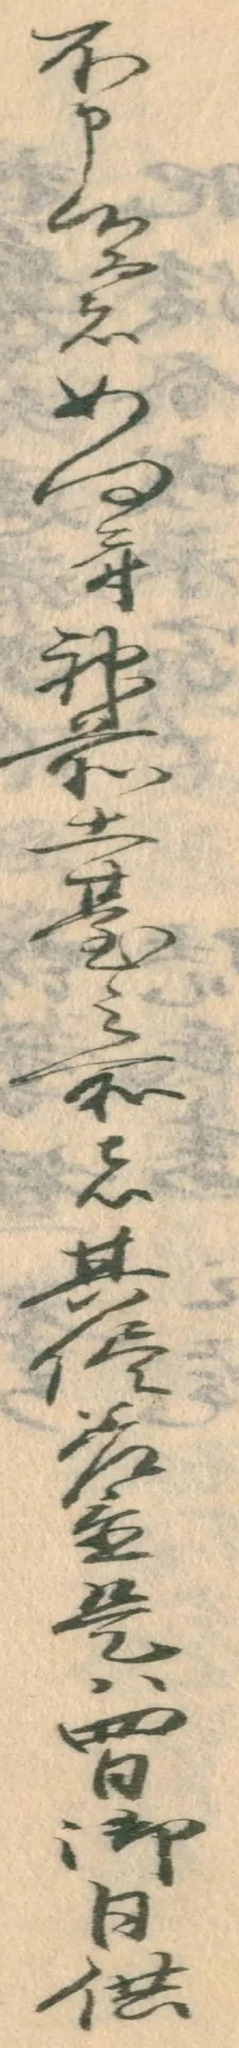不申候而は如何ニ付神前土台之所は其侭差置是ハ四日御日供
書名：賀茂社記録. 第17冊
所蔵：国立国会図書館 National Diet Library, JAPAN
